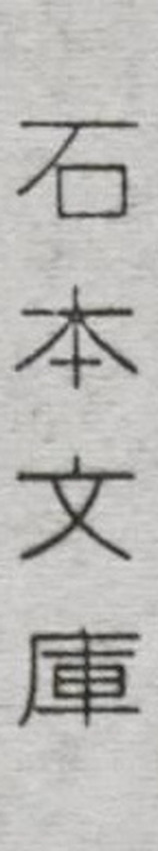石本文庫-
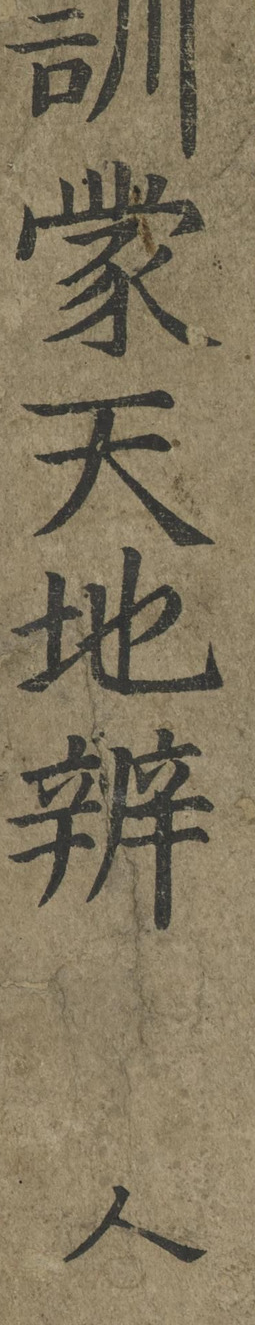訓蒙天地辨人

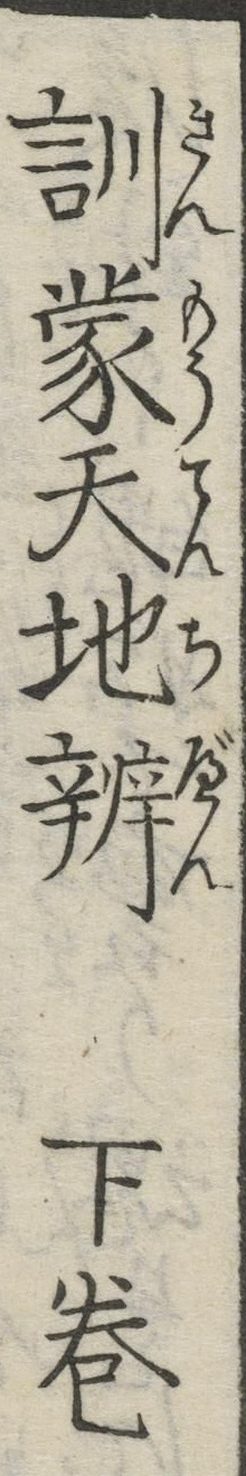訓蒙天地辨下巻
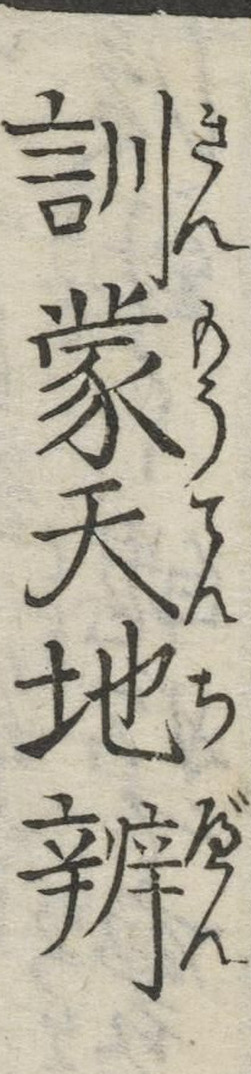訓蒙天地辨下巻
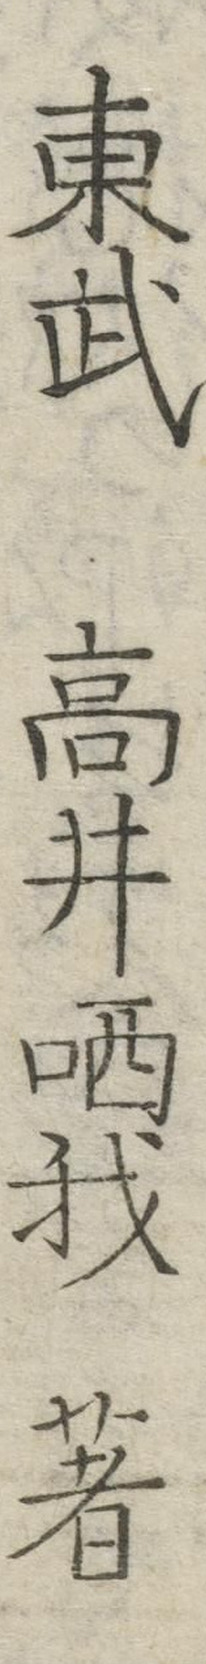東武高井哂我著
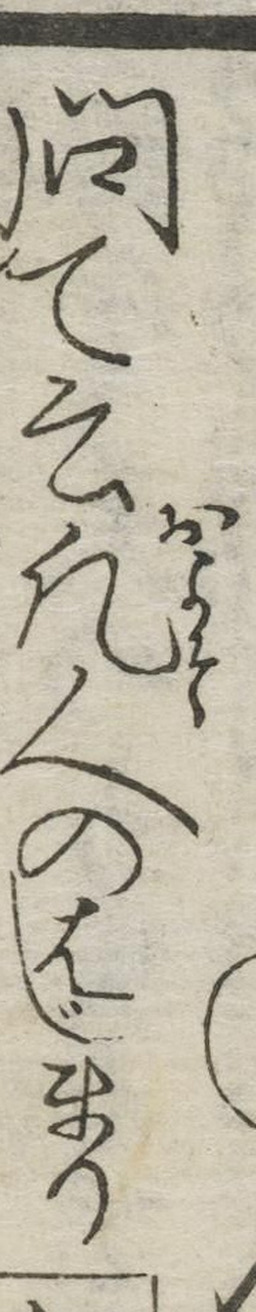問て云凡人のはじまり
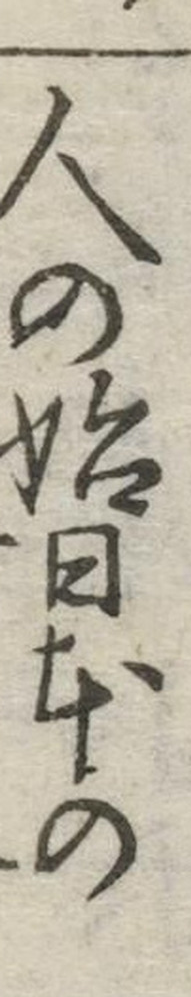人の始日本の
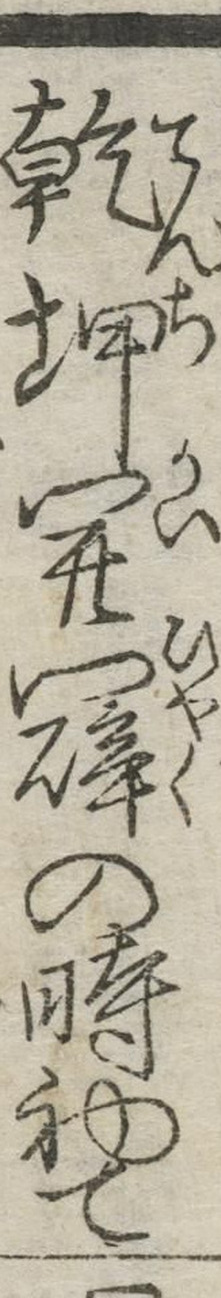乾坤開闢の時初て
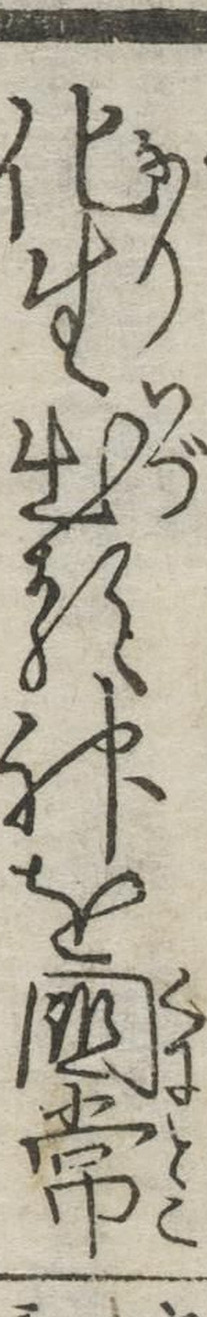化生出る神を国常
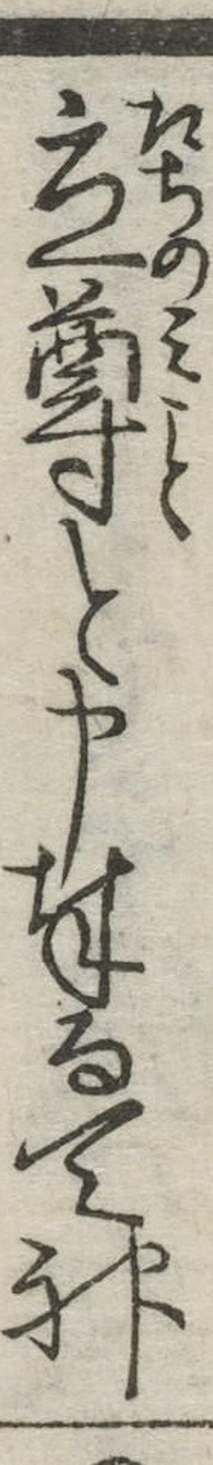立尊と申奉る天神
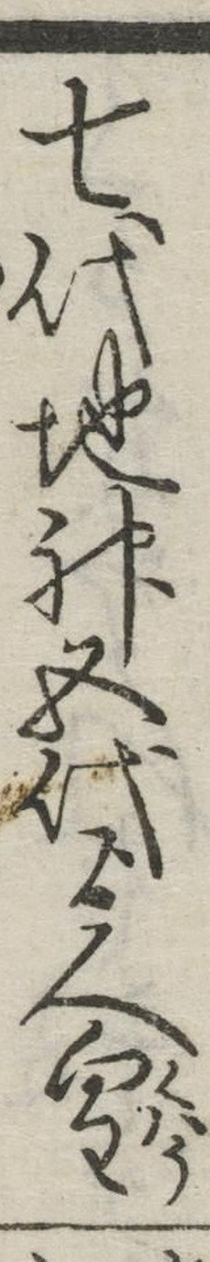七代地神五代ゟ人皇
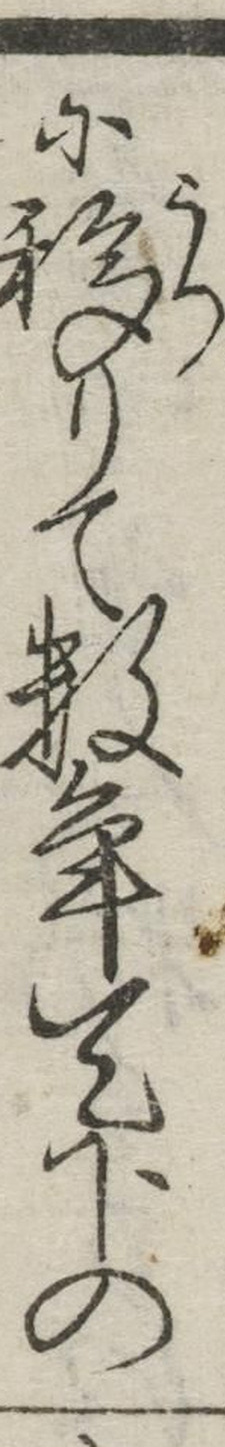に移りて数年天下の
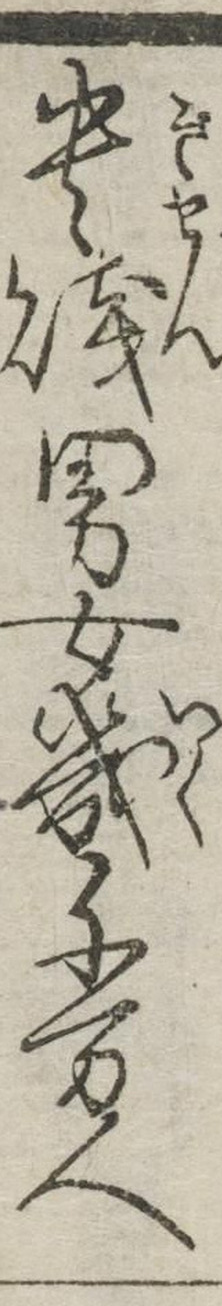貴賎男女幾千万人
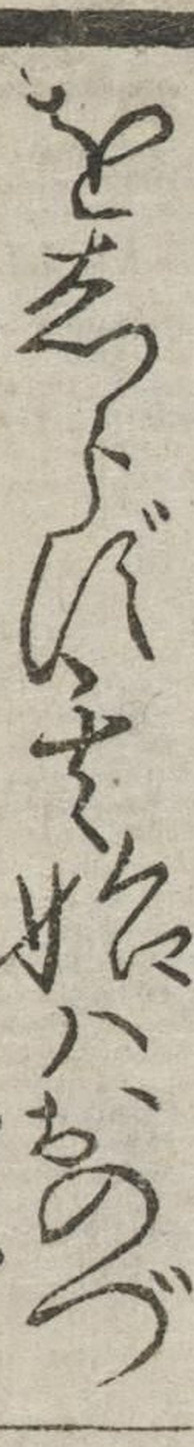をしらず其始はおのづ
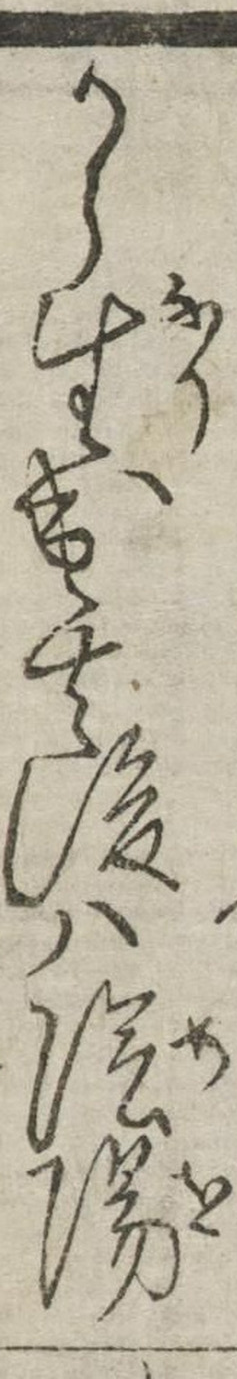から生出其後は陰陽
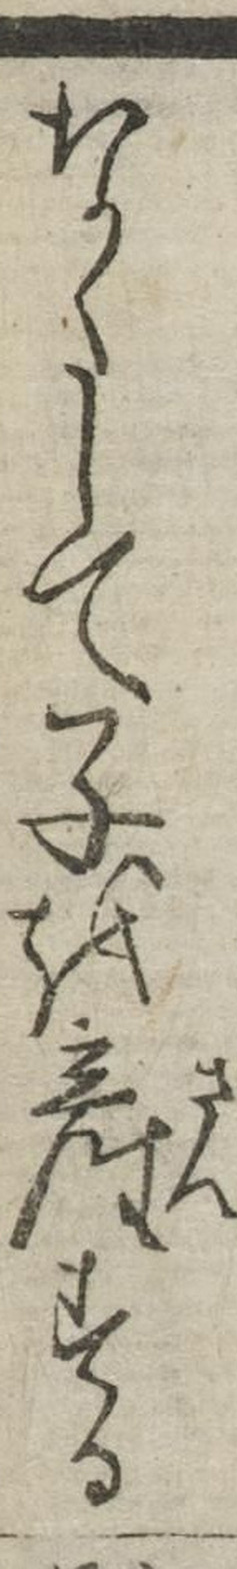なくして子を産する
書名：訓蒙天地辨　人
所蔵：東京大学地震研究所図書室 Earthquake Research Institute Library, The University of Tokyo, JAPAN
